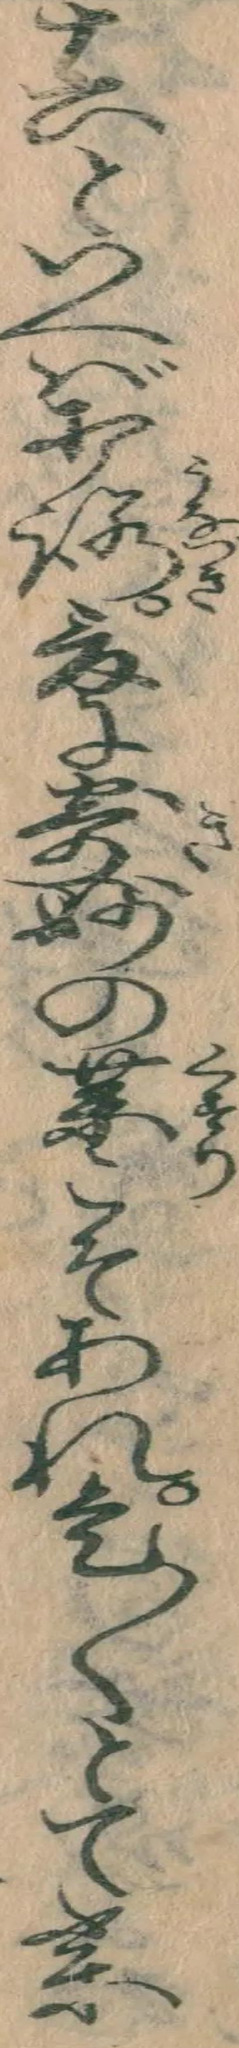十六といへば打頷。爰に寄妙の薬こそあれ。是々とて薬
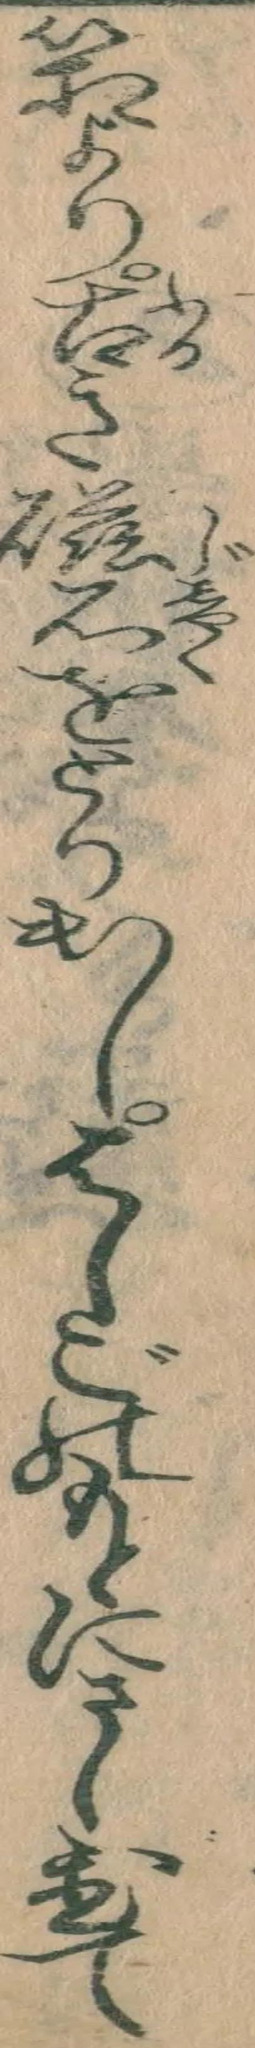箱より。古き磁石をとり出し。はしごのもとにさし置て
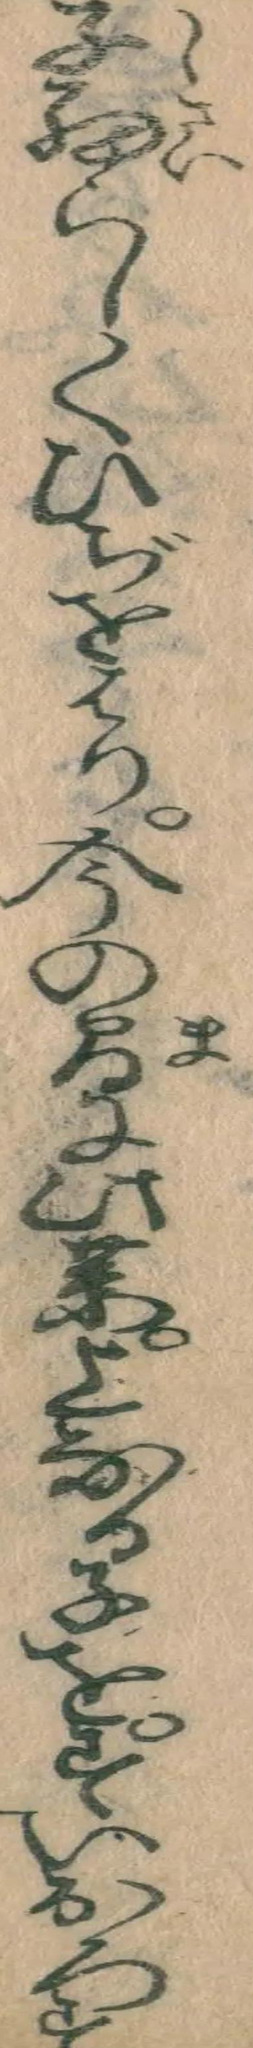子細らし〱ひぢをはり。今の間に此薬。上なる子を。すいおろす
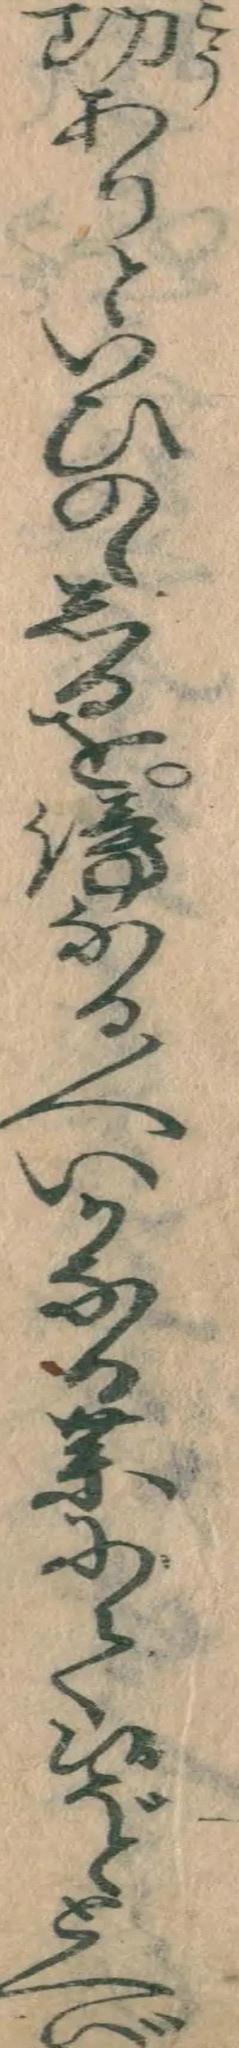功ありといひのゝしるを。傍なる人いかなる薬にて候ぞととへば
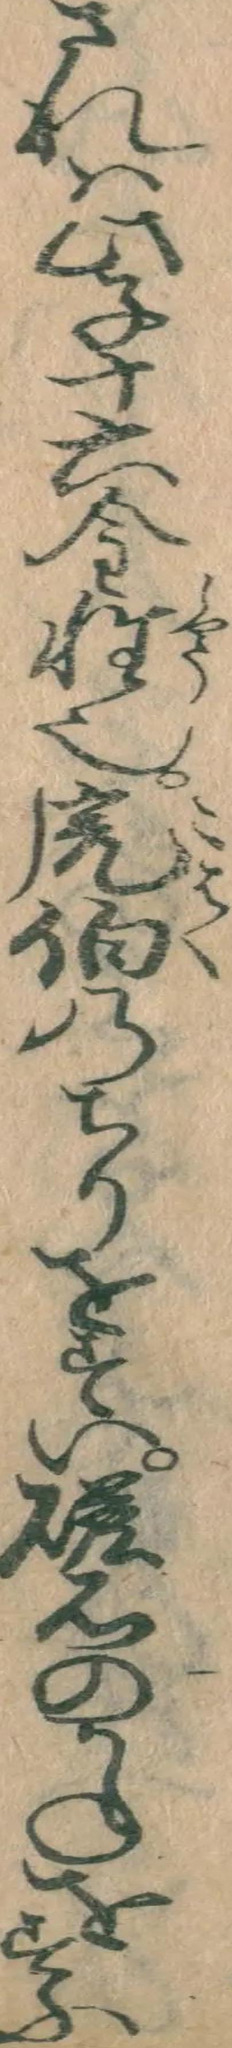されは此子十六金性也。琥珀のちりをすい。磁石のかねをすふ
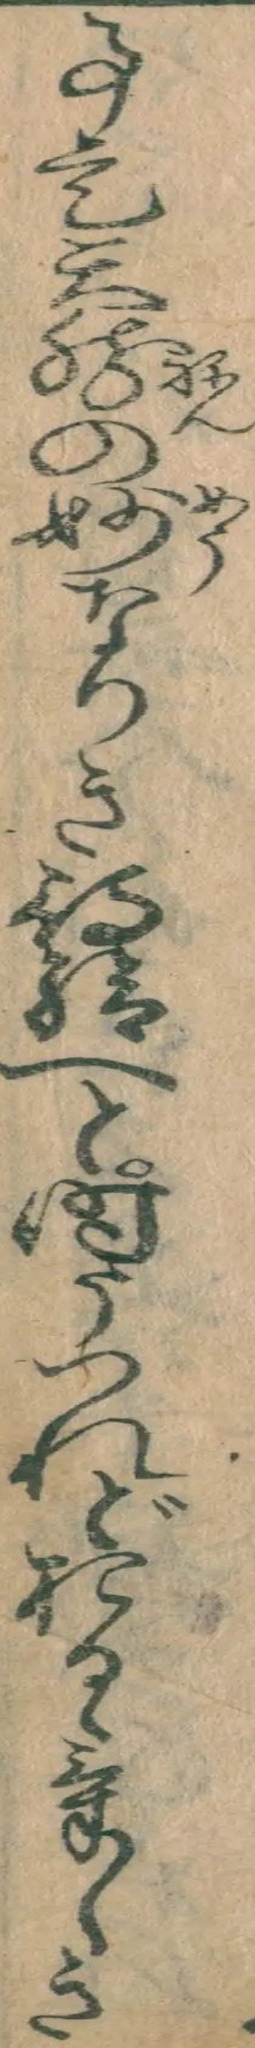事是天然の妙なりき待給へと。時うつれどおるゝけしき

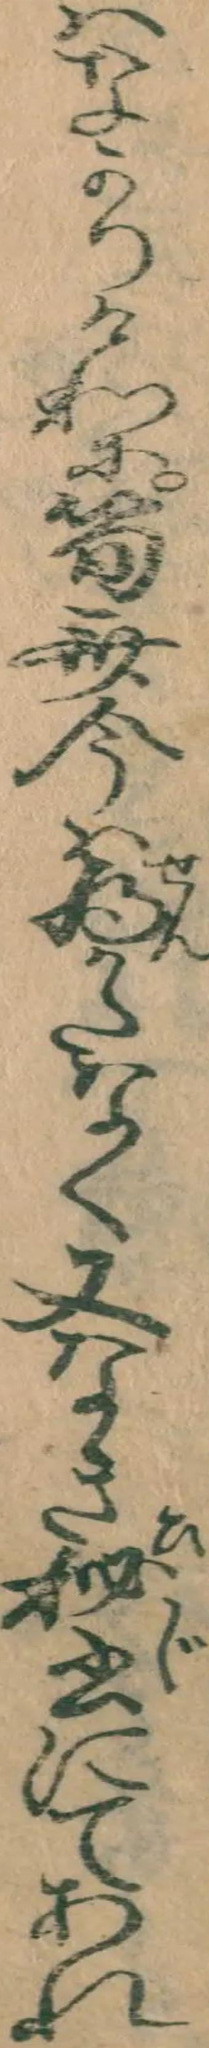はなかりけりに。筍斎今は為かたなく又なき秘書にてあれ
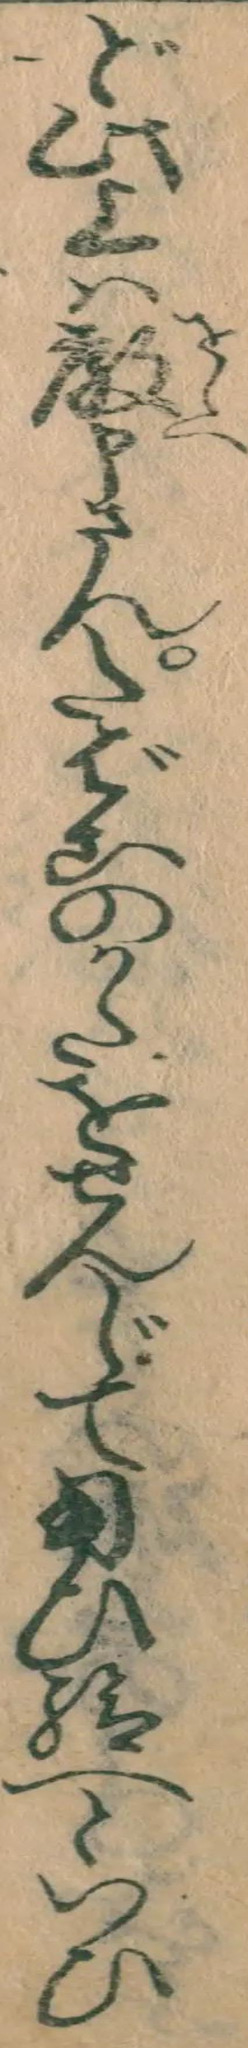ど此上は教申さん。たばこのかたをせんじて用ひ給へといひ
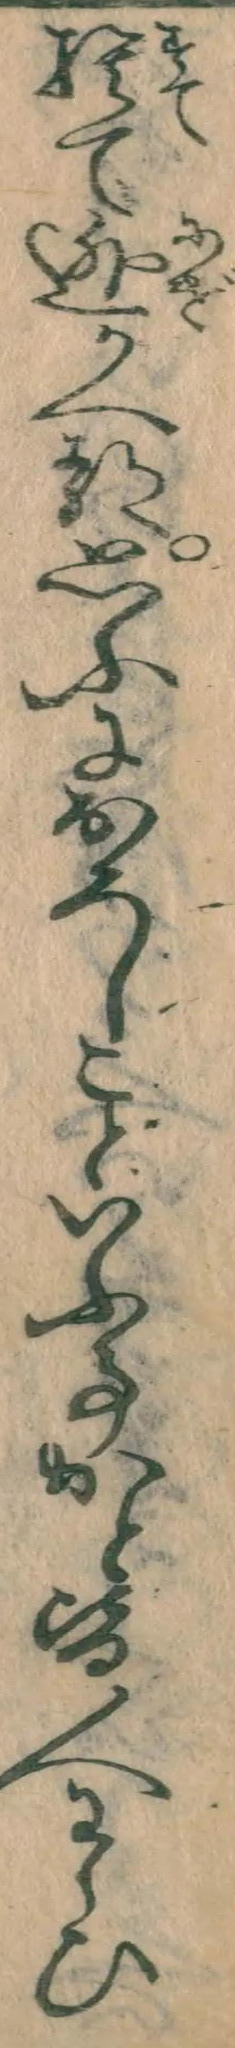捨て逃かへる。思ふにおろしこといふ事かと皆人わらひ
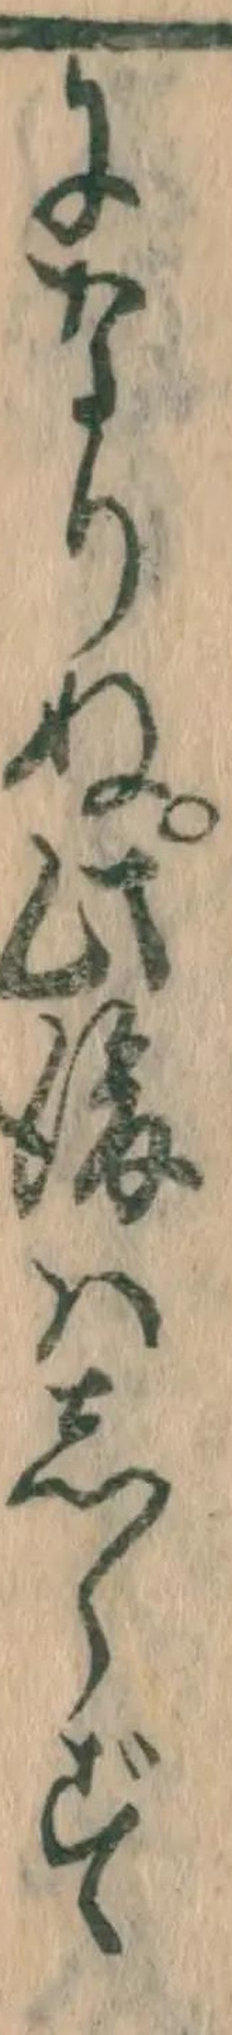になりぬ。此後はしらず
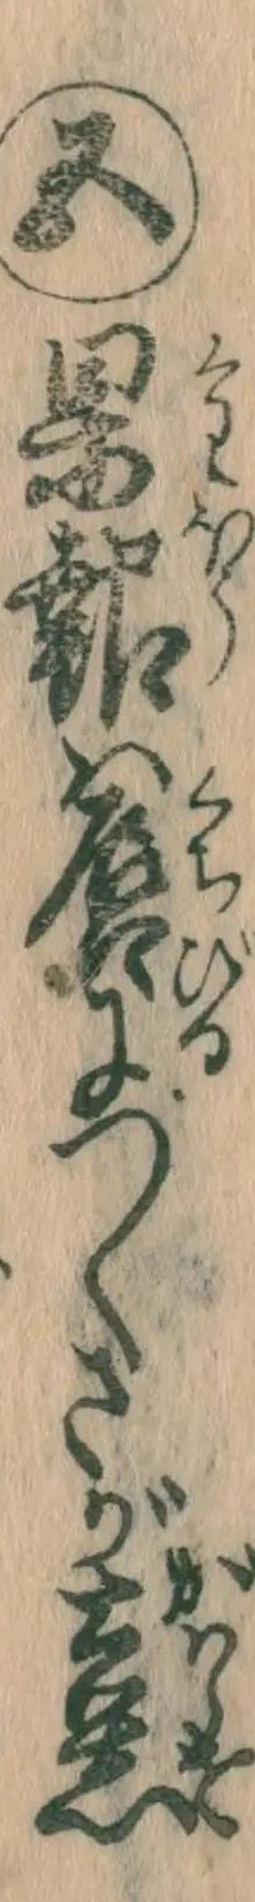五果報は唇につくさが土器
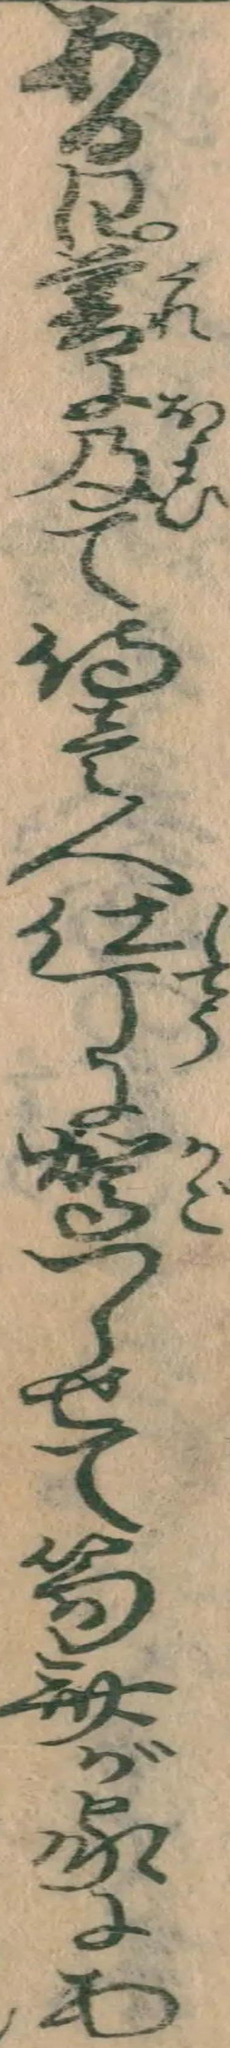ある日。暮に及て侍壱人仕丁に駕つらせて筍斎が家にあ
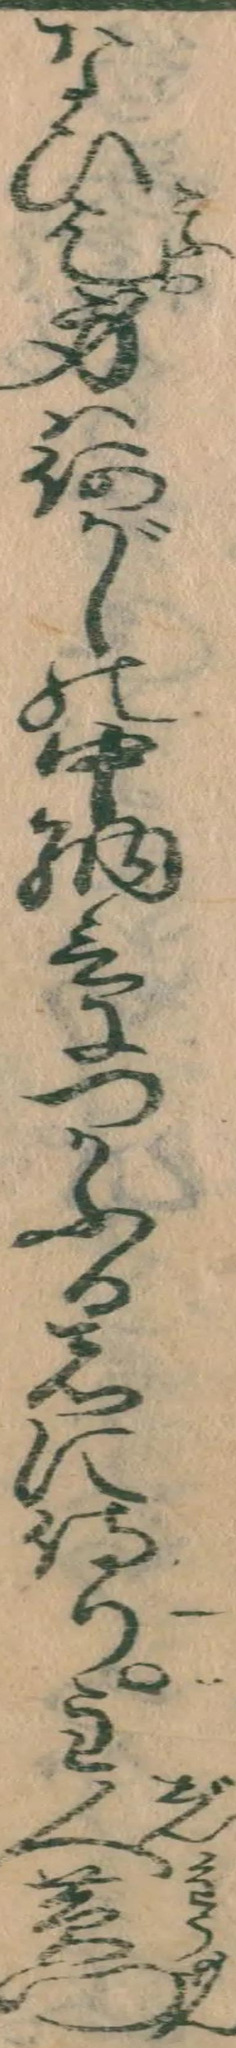なひ乞。身は何がしの中納言につかふる者に侍り。主人黄門
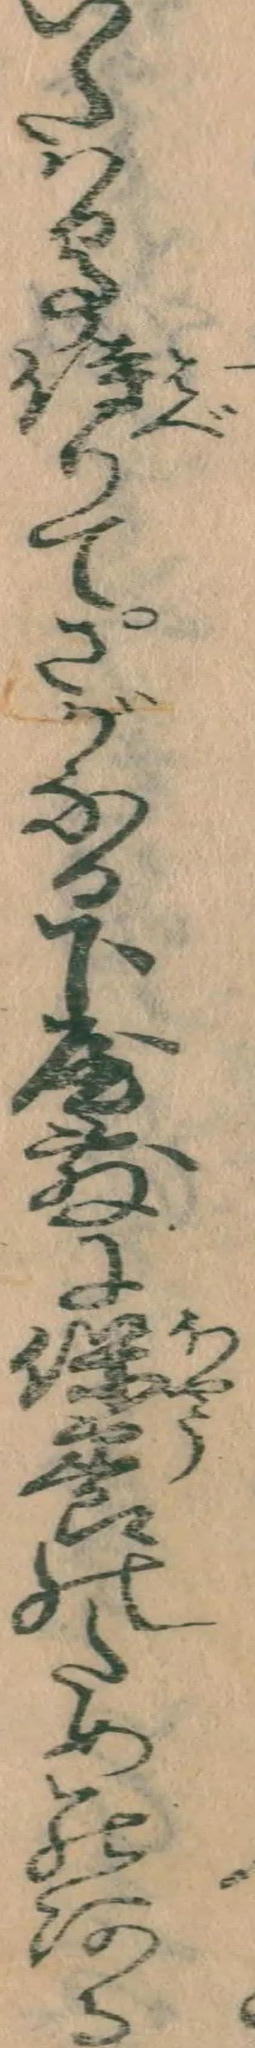いたはる事侍りて。さがなる下屋敷に保養のため罷ある
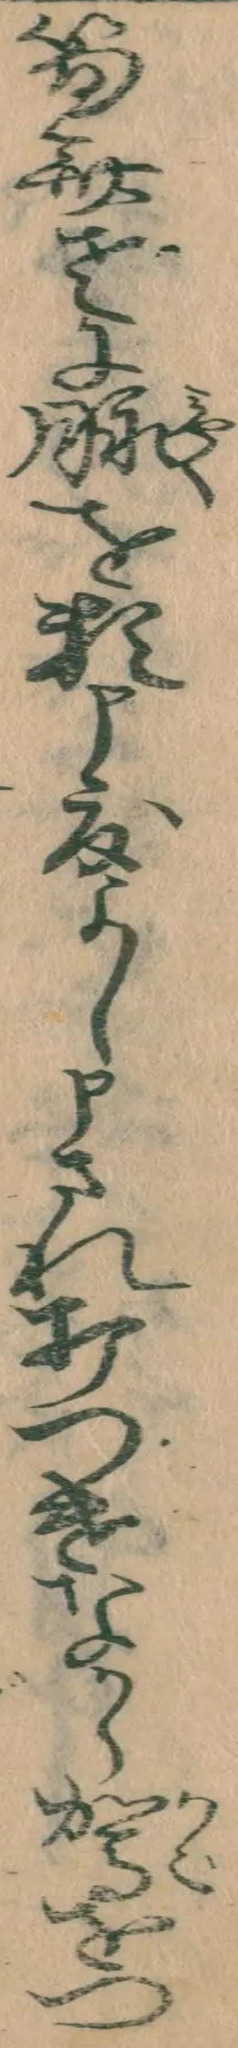筍斎老に脈を頼申度よし申され打つけなから駕をつ
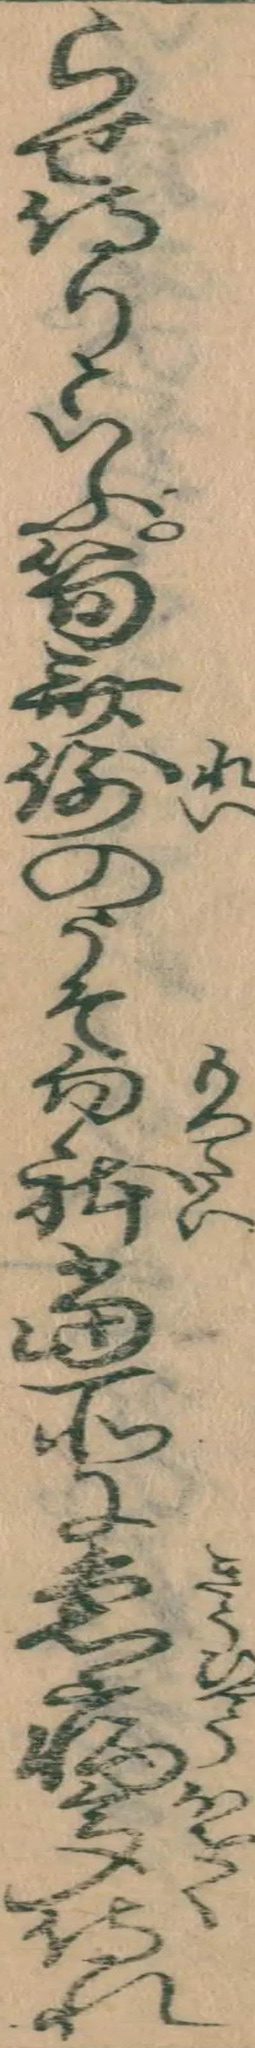らせ侍りといふ。筍斎例のうそ勿体当所に急病多侍れ
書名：新竹斎 5巻
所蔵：国立国会図書館 National Diet Library, JAPAN
